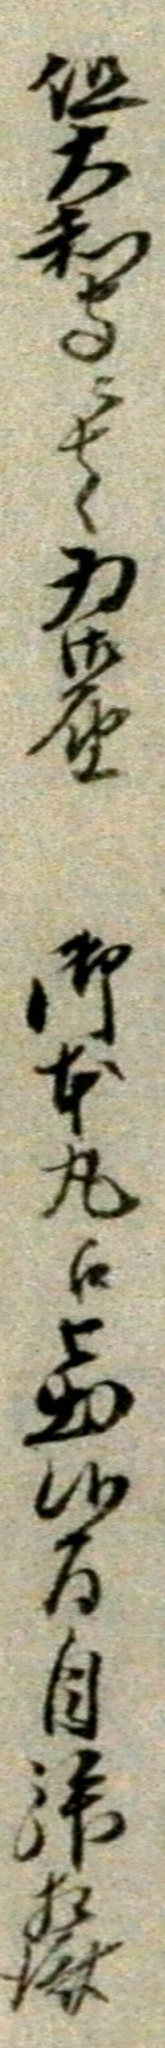但大和守ニは為御届御本丸え被出候間自拝相済
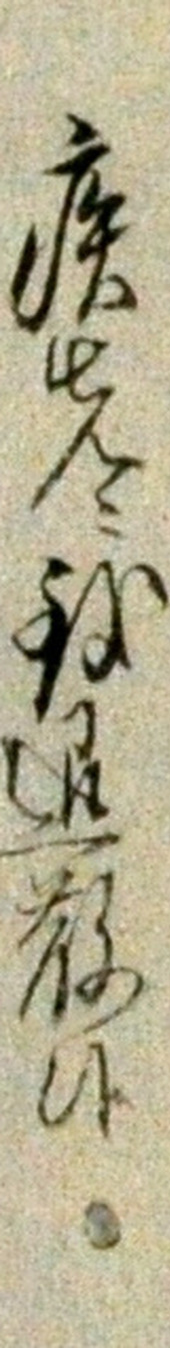疾先ニ致退散候
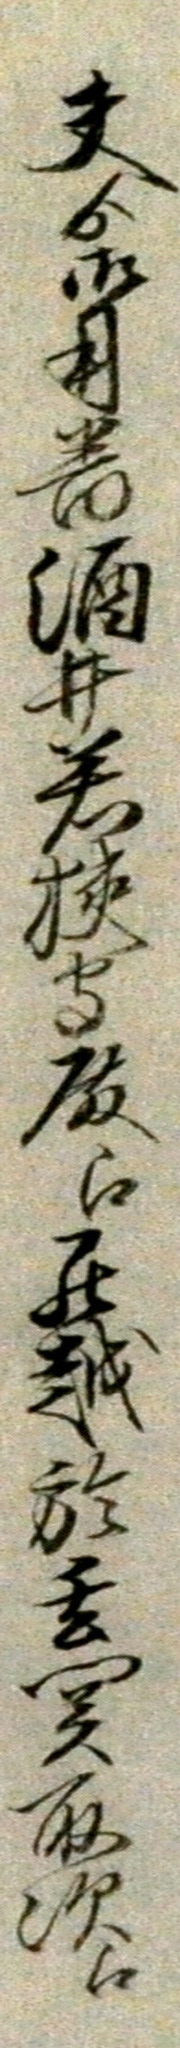夫ゟ御用番酒井若狭守殿え罷越於玄関取次え
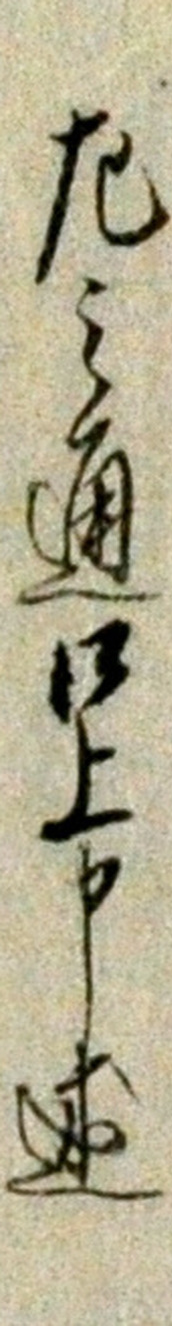左之通口上申述
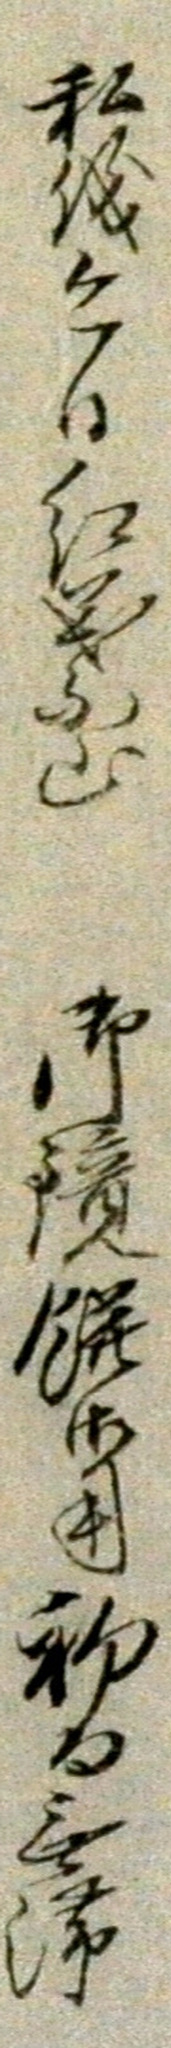私儀今日紅葉山御鏡餅御用初而無滞
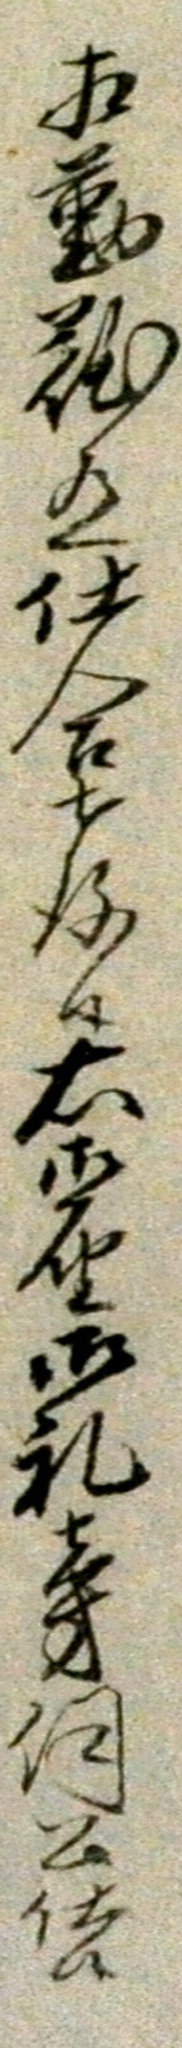相勤難有仕合奉存候右御届御礼旁伺公仕候
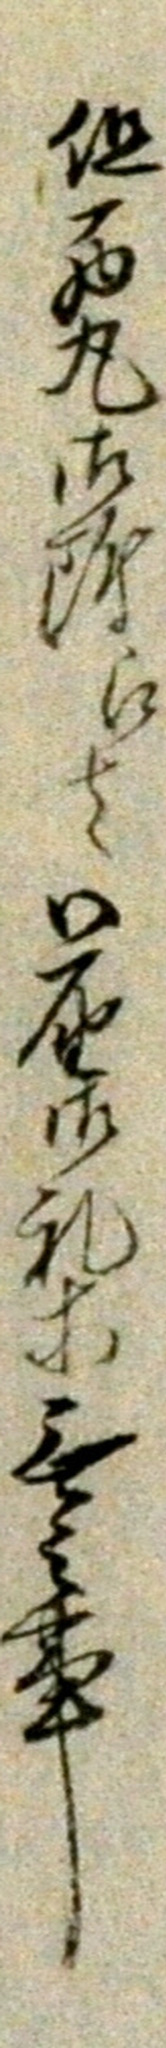但西丸御附えは御届御礼等無之事
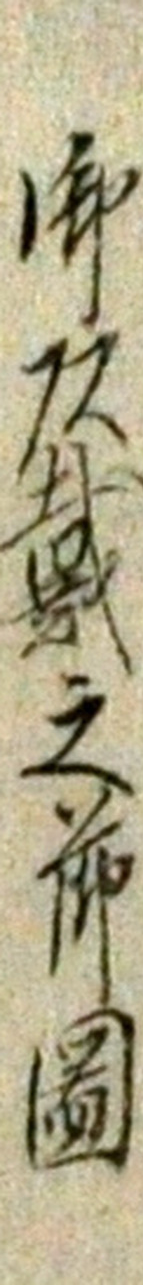御頂戴之節図

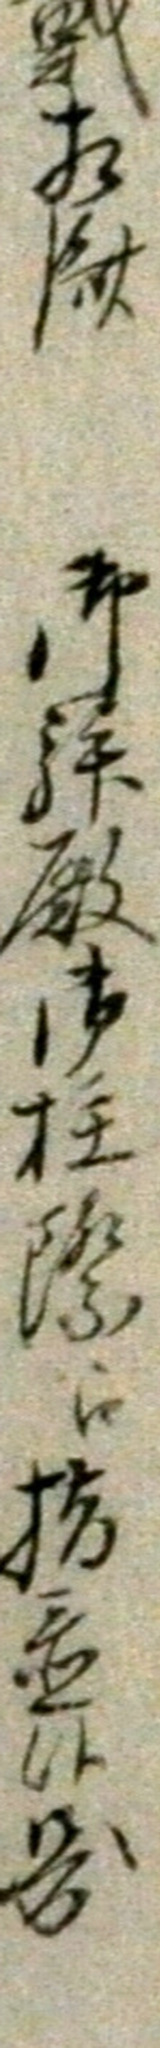御頂戴相済御拝殿御柱際え指置候図
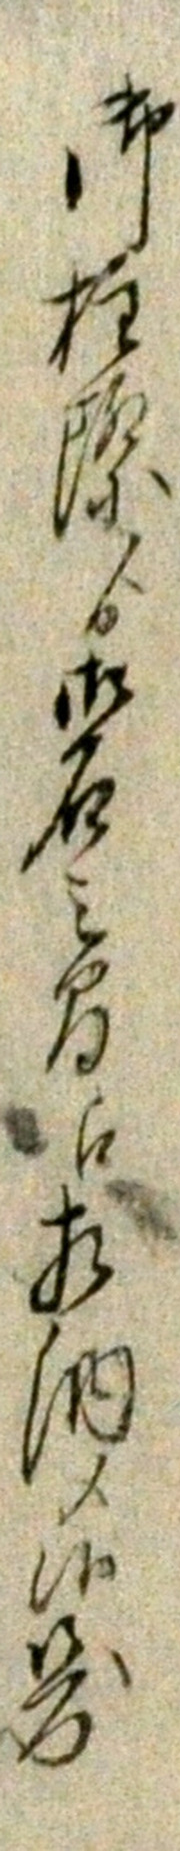御柱際ゟ御石之間え相納メ候図

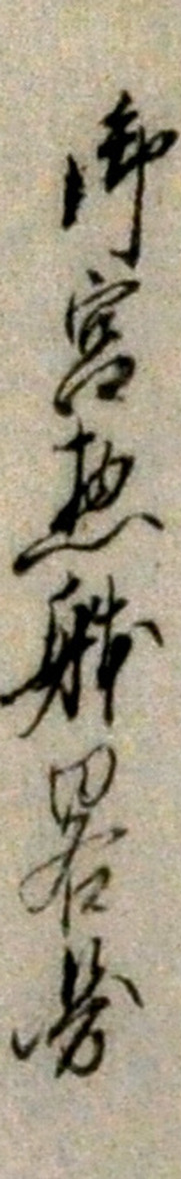御宮惣躰略図
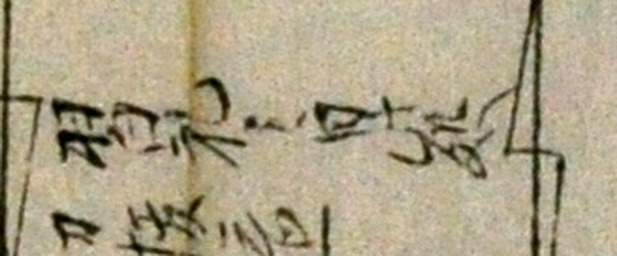習礼之日此処へ
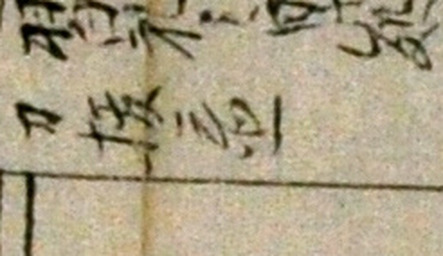刀抜置
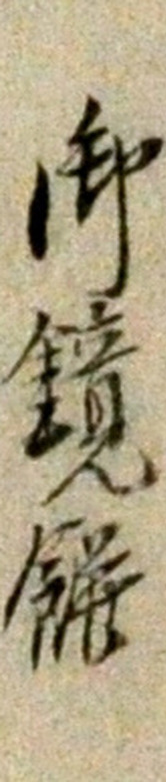御鏡餅
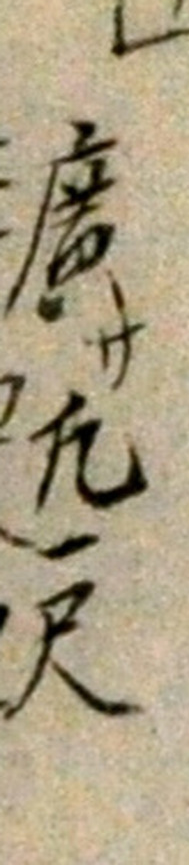広サ凡一尺
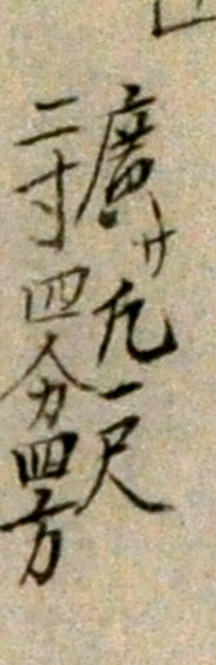広サ凡一尺
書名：御鏡餅御用留（写）
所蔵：伊那市立高遠町図書館・合同会社AMANE
